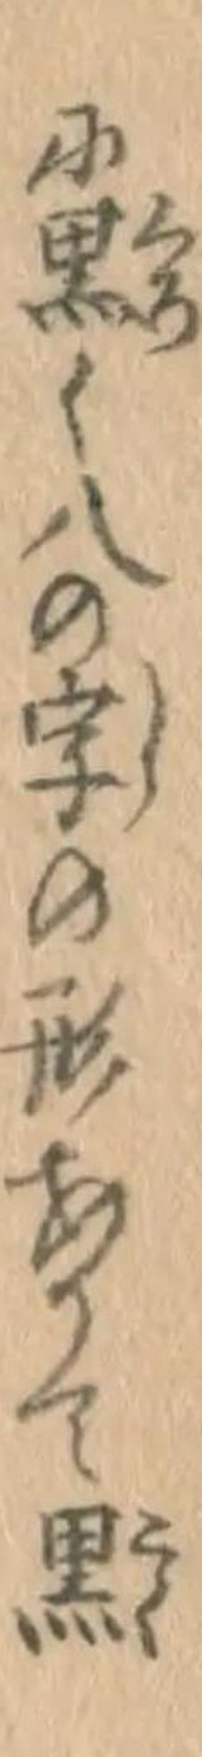に黒く八の字の形ありて黒

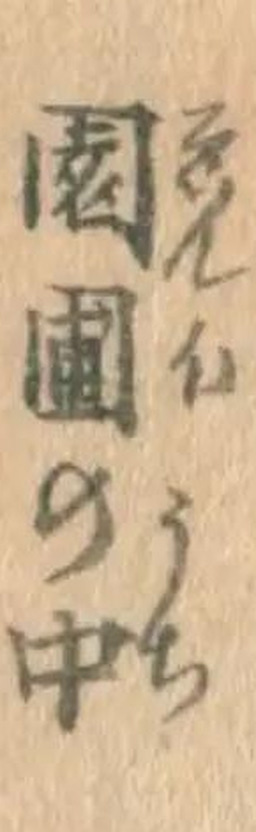園圃の中
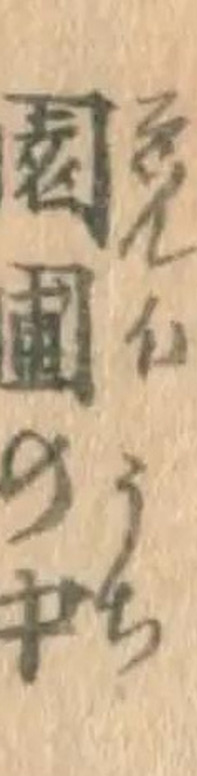園圃の中
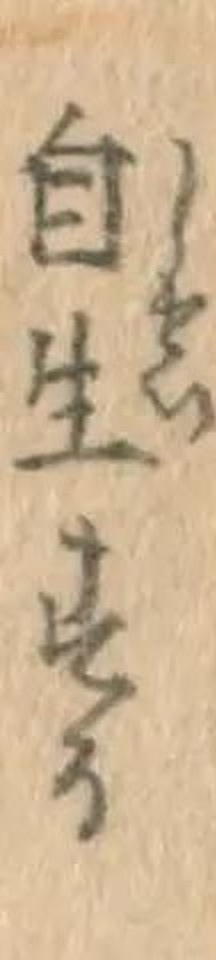自生する
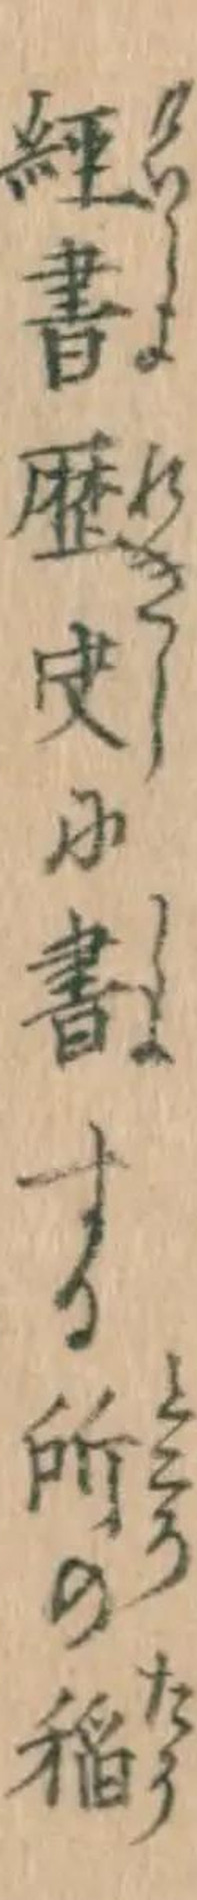経書歴史に書する所の稲
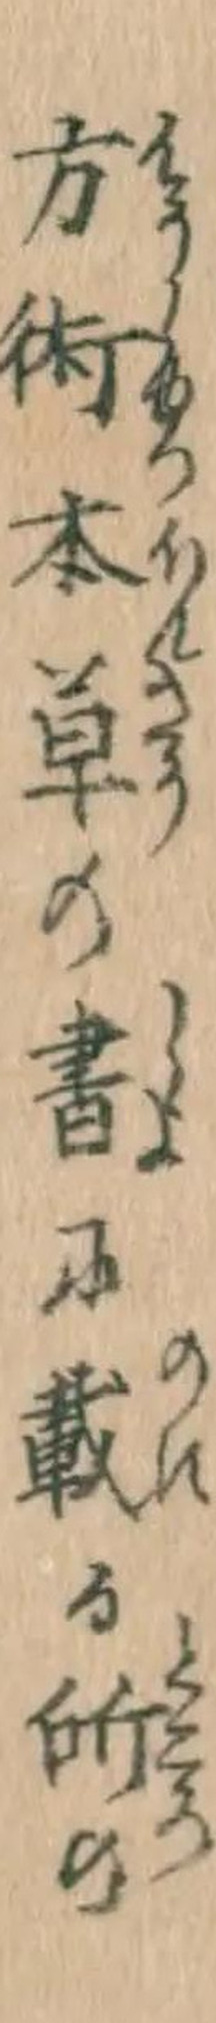方術本草の書に載る所の
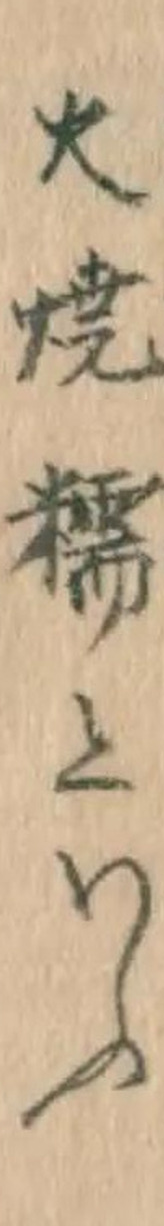火焼糯といふ

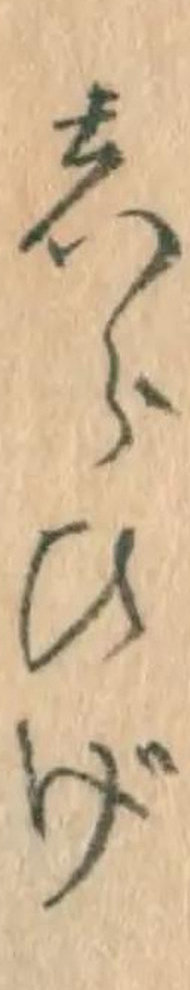しらひげ
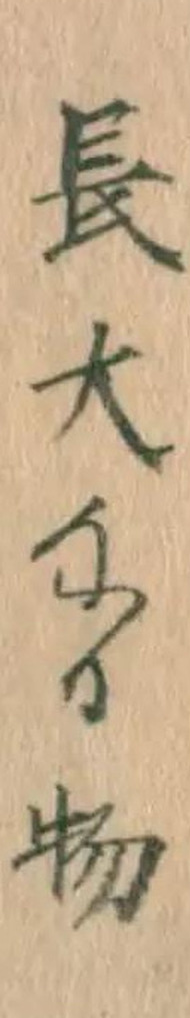長大なる物

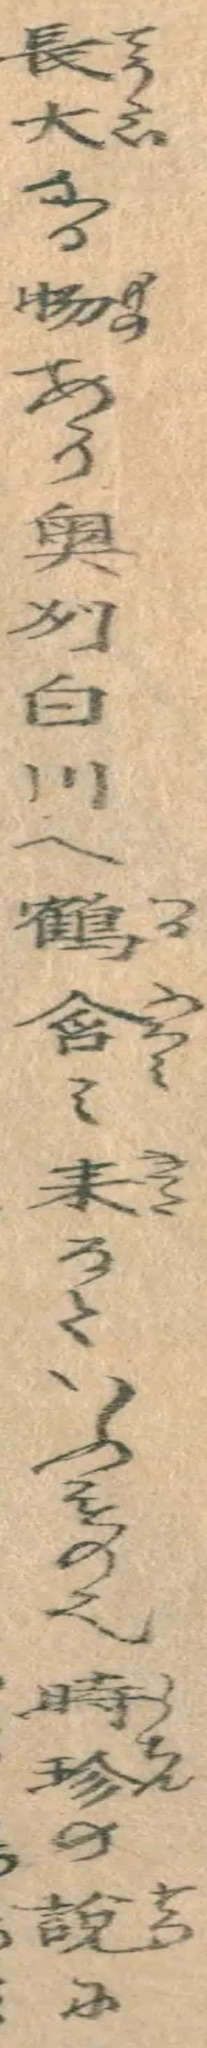長大なる物あり奥州白川へ鶴含み来るといふもの也時珍の説に
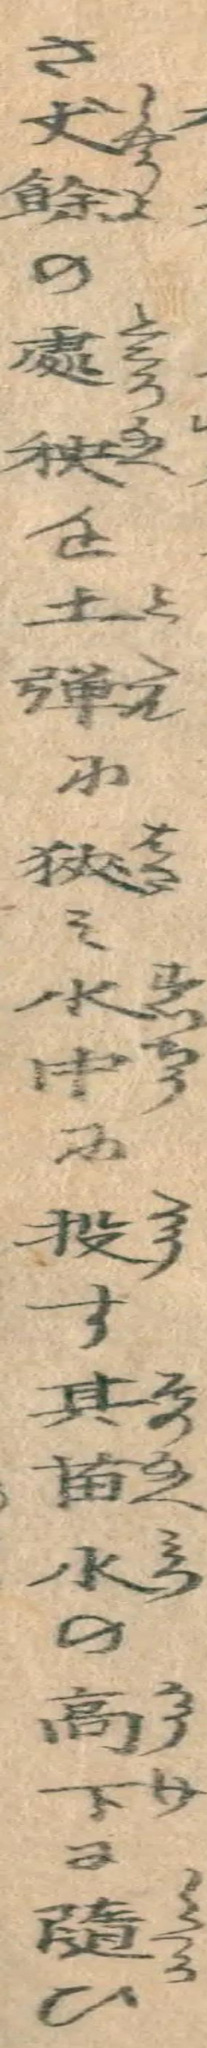さ丈余の処秧を土弾に挟み水中に投す其苗水の高下に随ひ
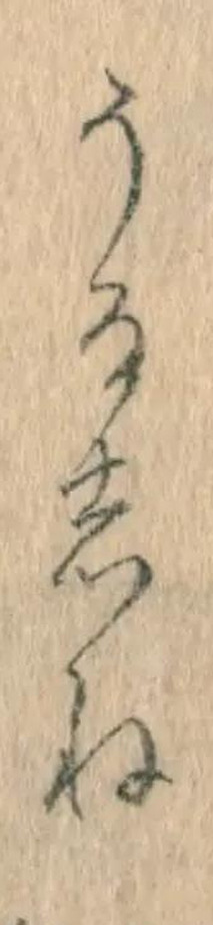うるしね
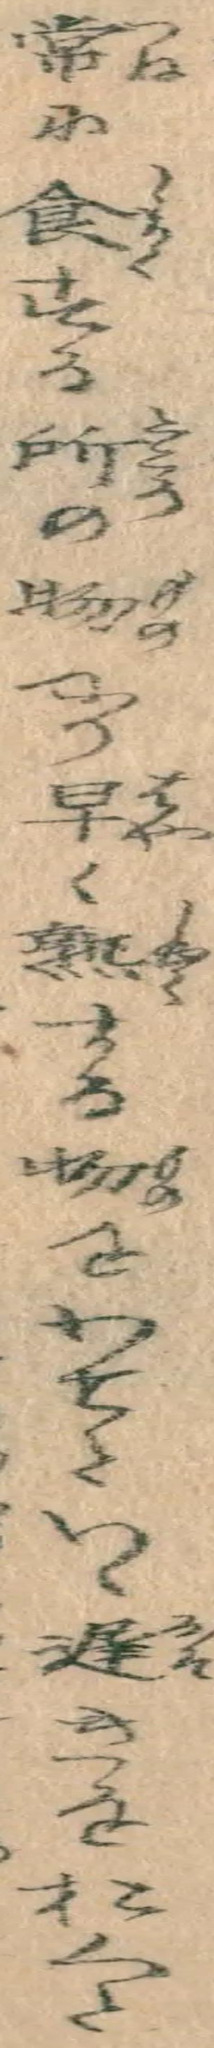常に食する所の物なり早く熟する物をわせといゝ遅きをおくと
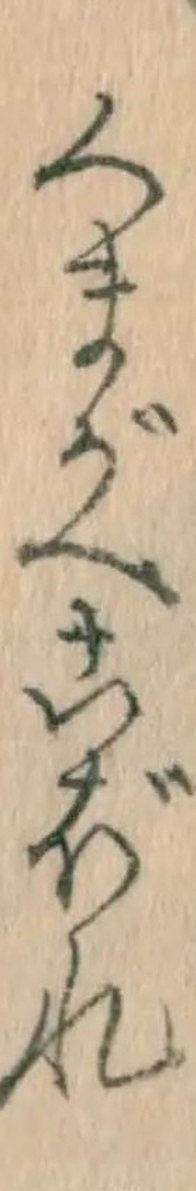くまがへこぼれ

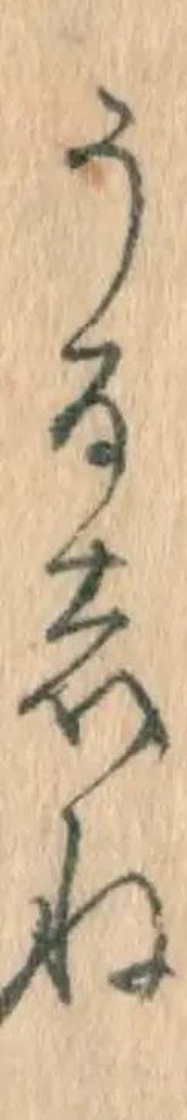うるしね

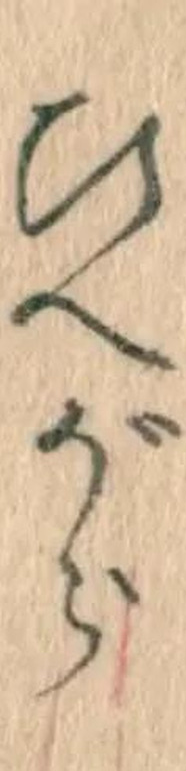ひへがら
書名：本草図譜. 巻40-42
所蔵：国立国会図書館 National Diet Library, JAPAN
